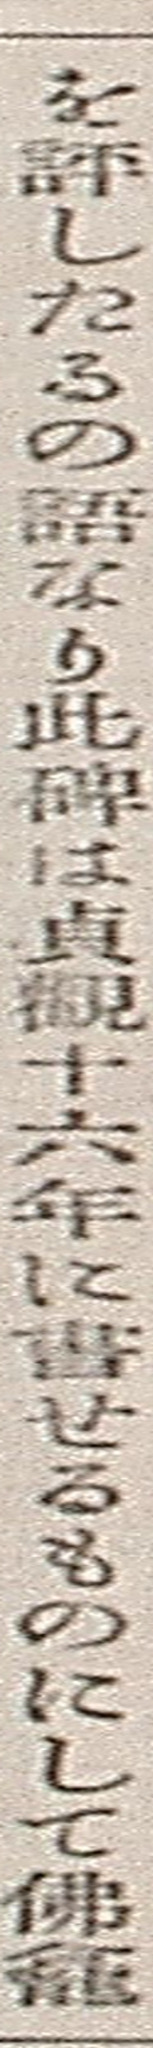を評したるの語なり此碑は貞観十六年に書せるものにして佛龕
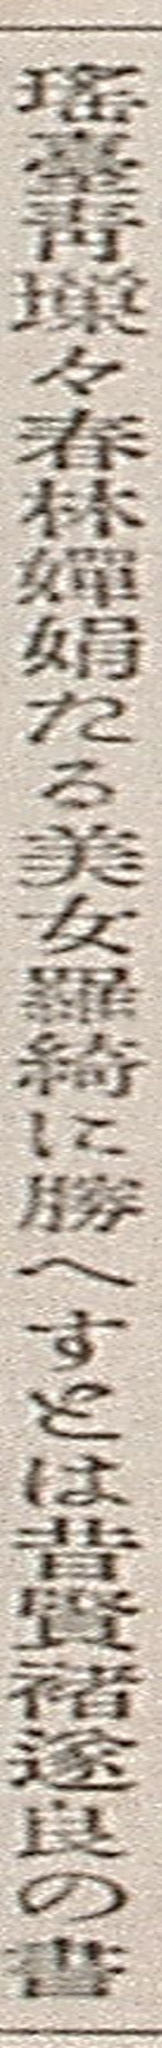瑤臺青璅々春林嬋娟たる美女羅綺に勝へすとは昔賢褚遂良の書
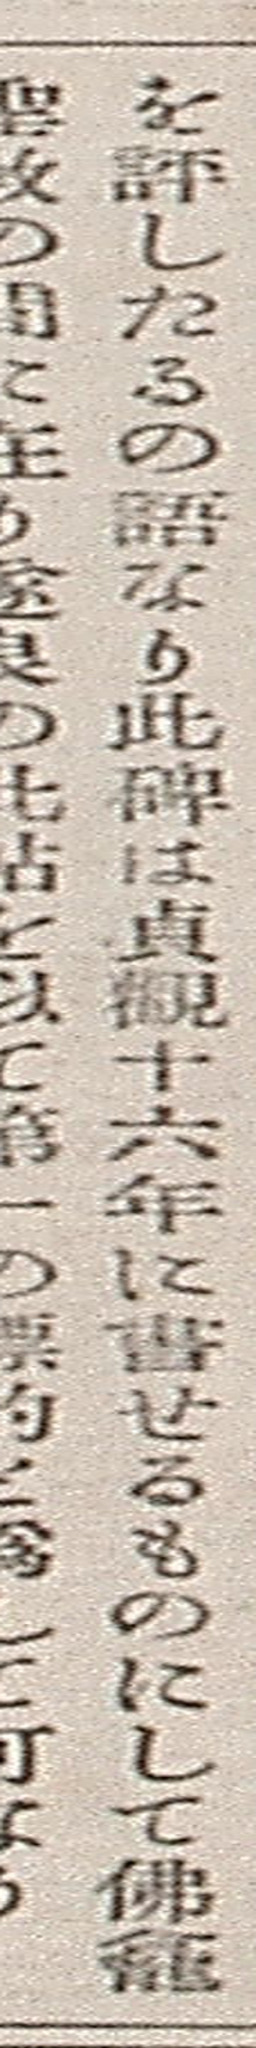聖教の間に在り遂良の此帖を以て第一の標的と為して可なり
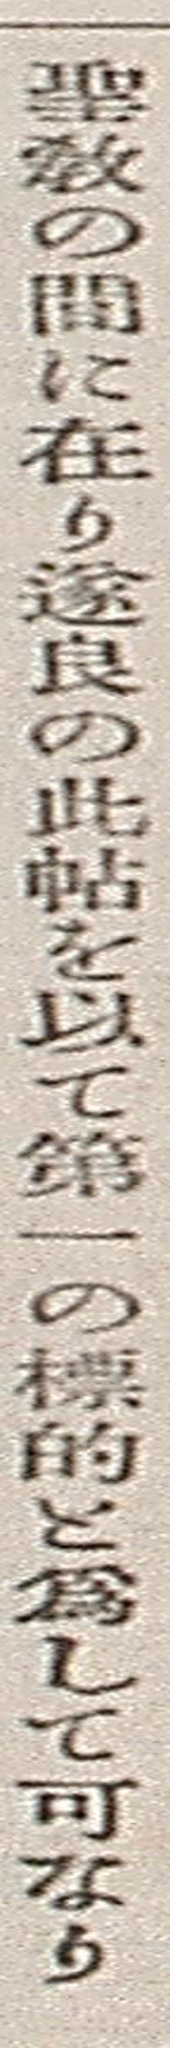聖教の間に在り遂良の此帖を以て第一の標的と為して可なり
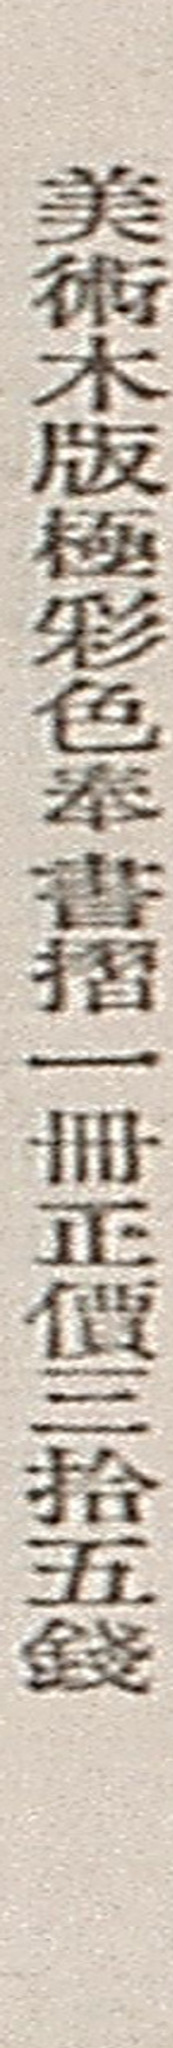美術木版極彩色奉書摺一冊正価三十拾銭
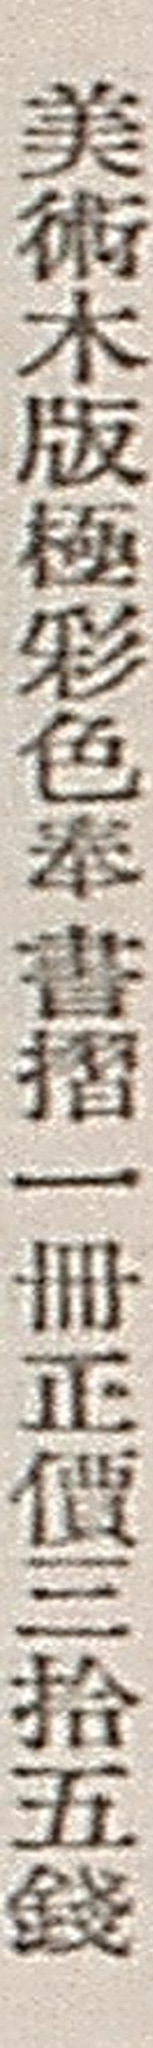美術木版極彩色奉書摺一冊正価三十拾銭
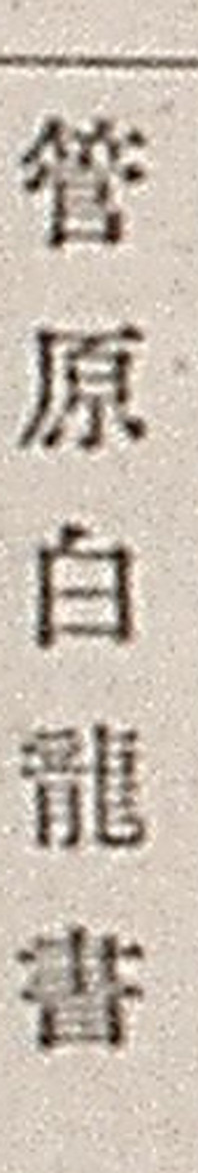管原白龍書
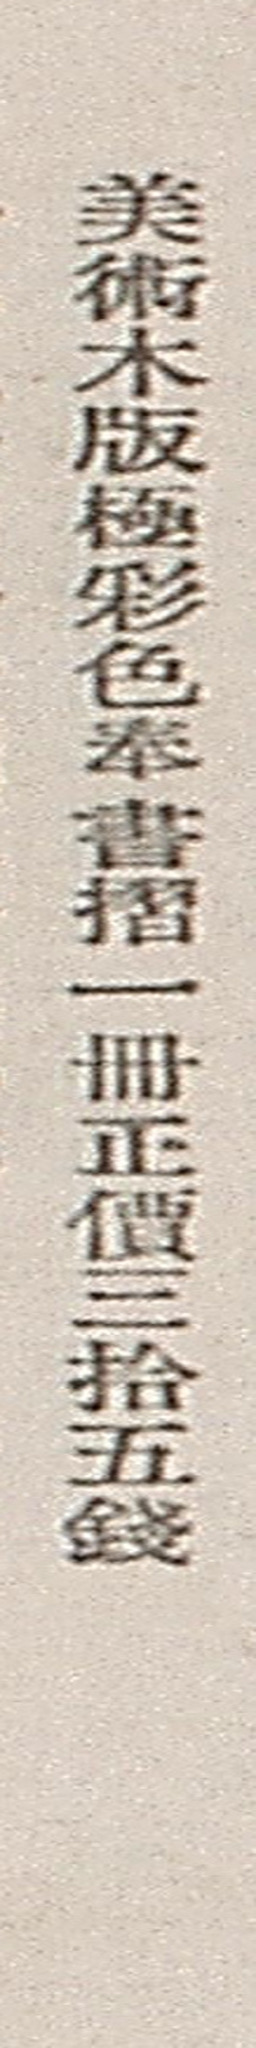美術木版極彩色奉書摺一冊正価三十拾銭
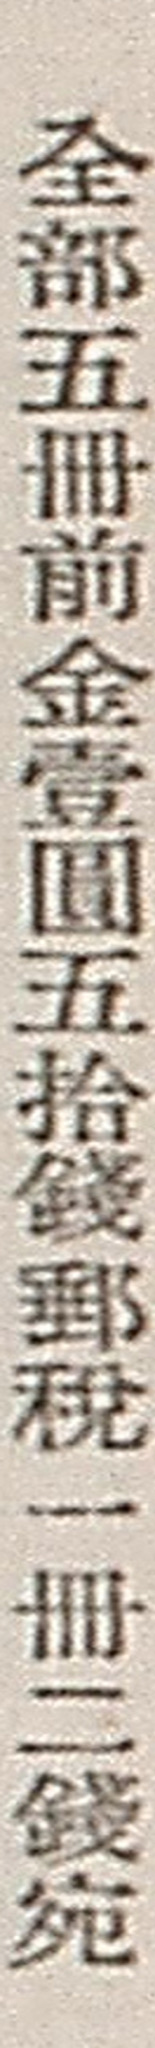全部五冊前金壱圓五拾銭郵税一冊二銭宛
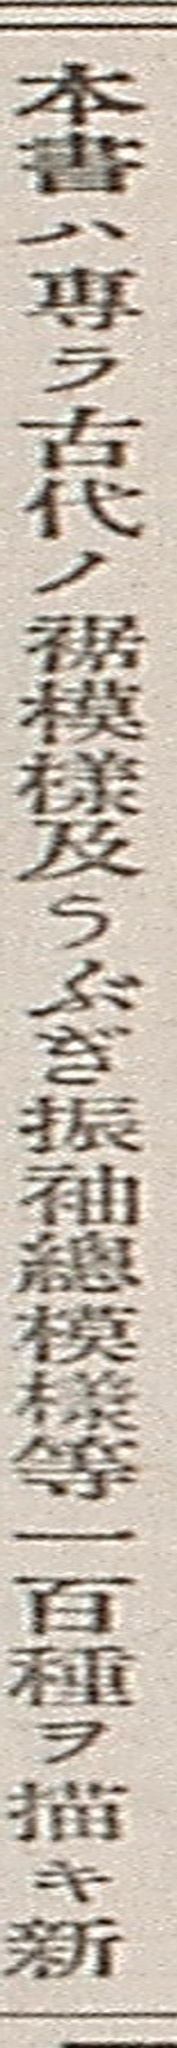本書ハ専ラ古代ノ裾模様及うぶぎ振袖総模様等一百種ヲ描キ新
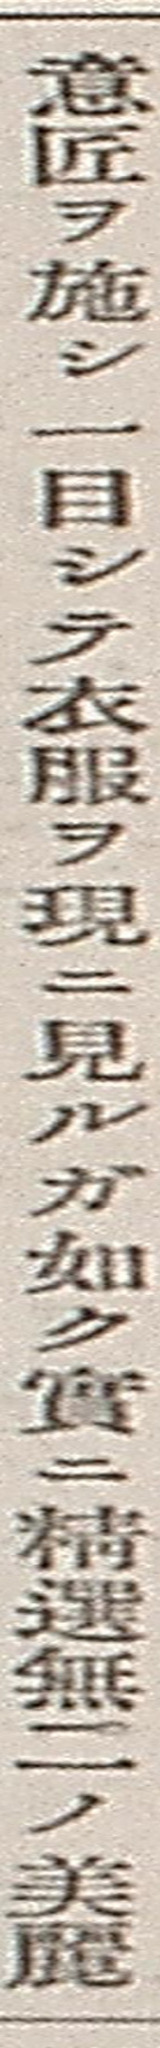意匠ヲ施シ一目シテ衣服ヲ現二見ルガ如ク実二精選無二ノ美麗
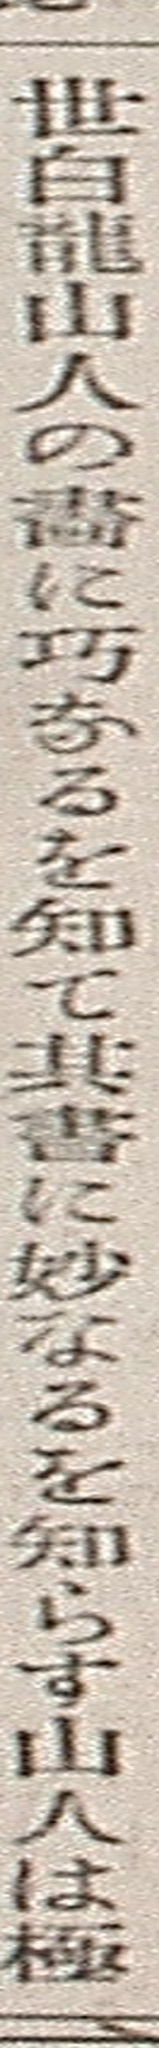世白龍山人の畫に巧なるを知て其書に妙なるを知らす山人は極
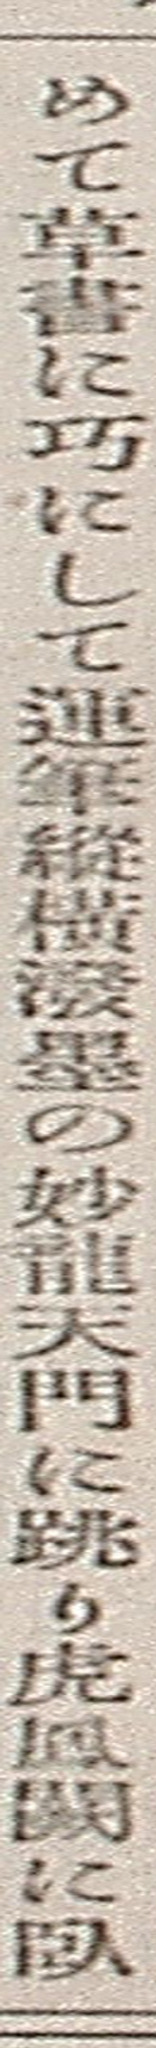めて草書に巧にして運筆縦横溌墨の妙龍天門に跳り虎鳳闕に臥
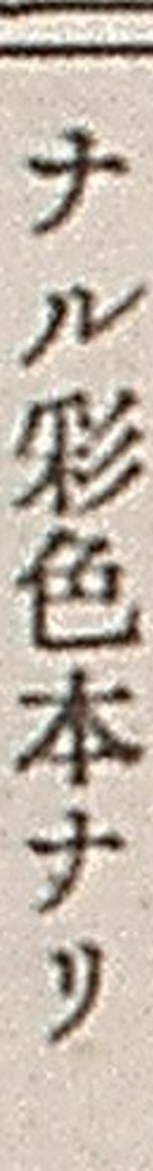ナル彩色本ナリ
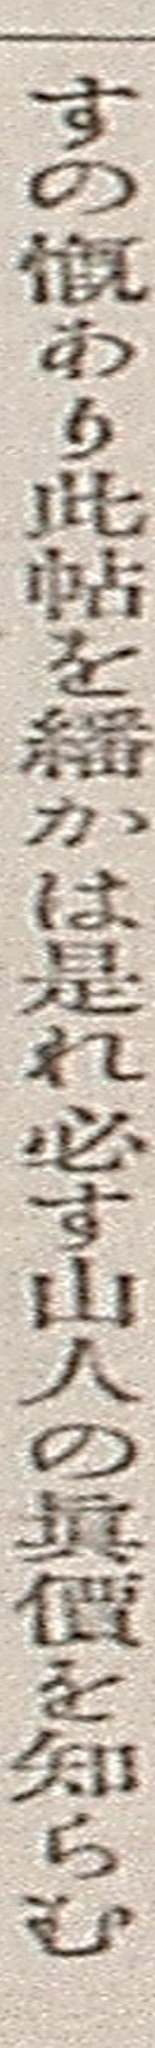すの概あり此帖を繙かは是れ必す山人の真価を知らむ
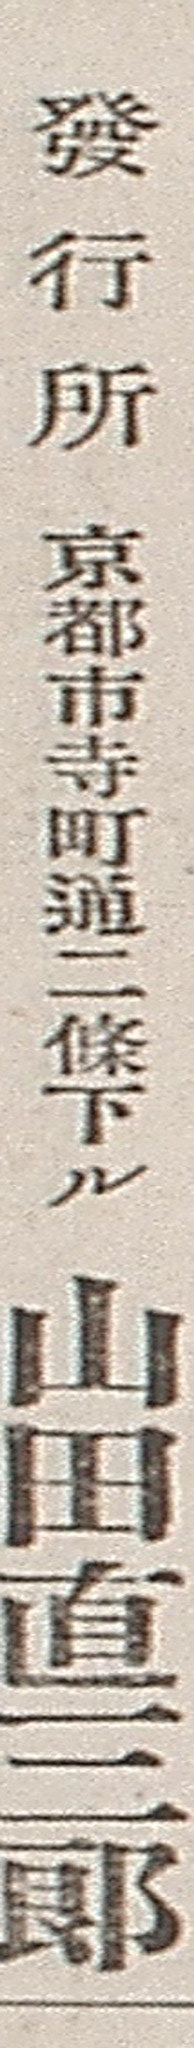発行所京都市寺町通二條下ㇽ山田直三郎
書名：風俗畫報臨時増刊第百二十六號　洪水被害録（中）
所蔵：東京大学地震研究所図書室 Earthquake Research Institute Library, The University of Tokyo, JAPAN
